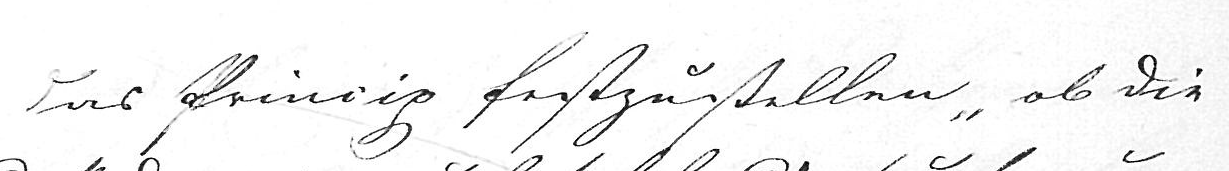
das Princip festzustellen, ob die
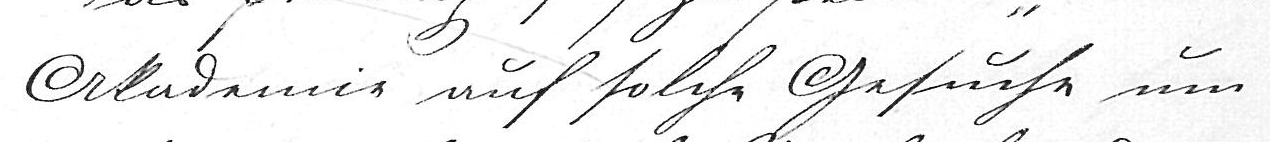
Akademie auf solche Gesuche um
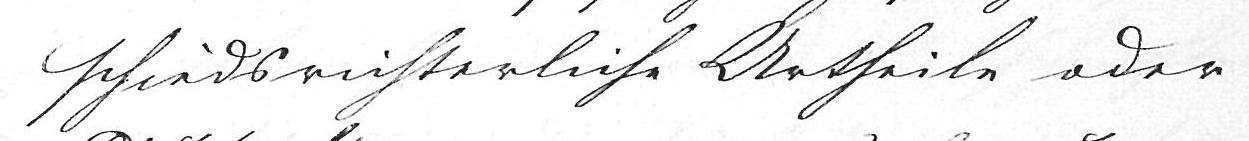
schiedsrichterliche Urtheile oder
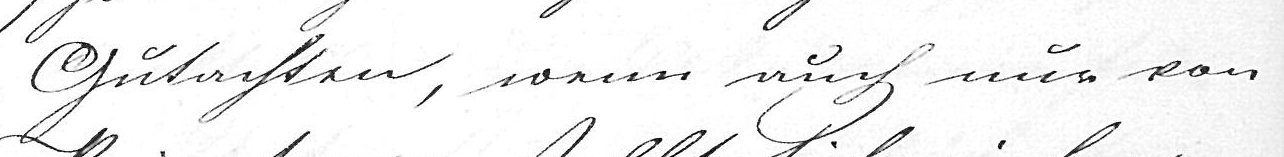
Gutachten, wenn auch nur von
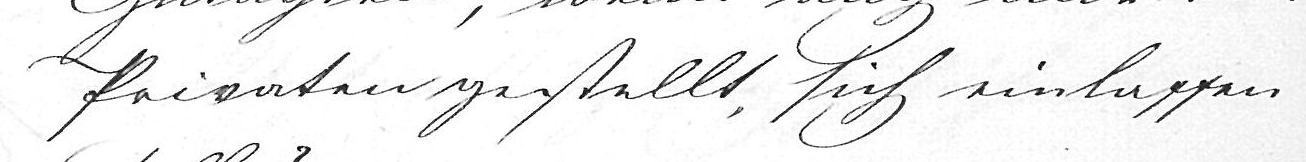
Privaten gestellt, sich einlassen
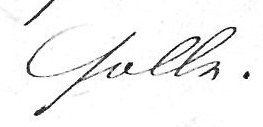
solle?
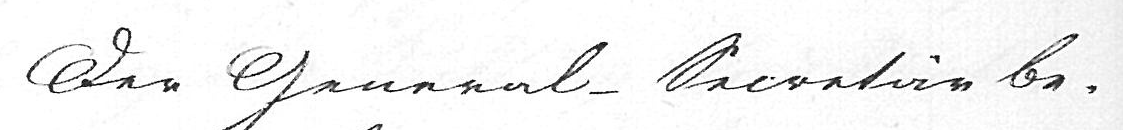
Der General-Secretär be-
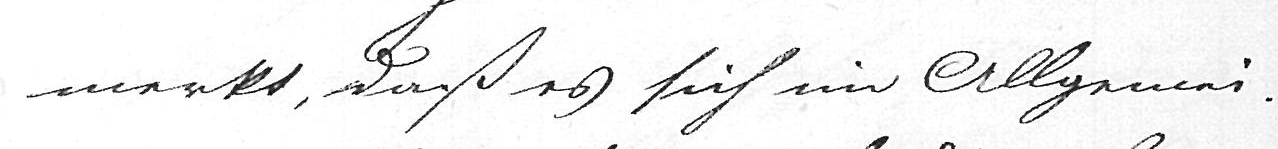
merkt, daß es sich im Allgemei-
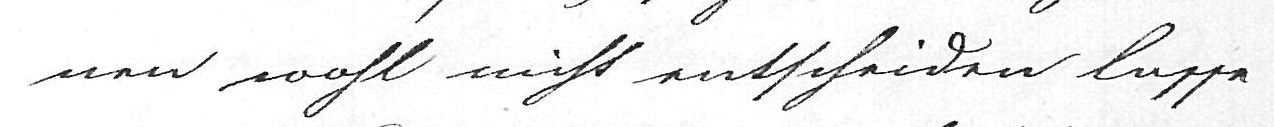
nen wohl nicht entscheiden lasse
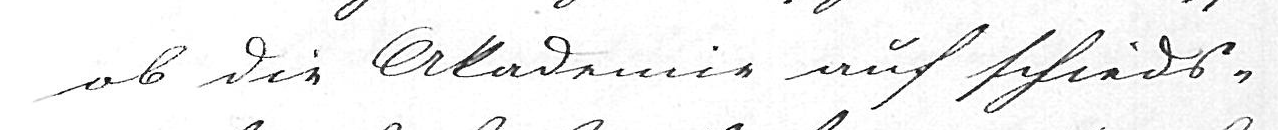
ob die Akademie auf schieds-
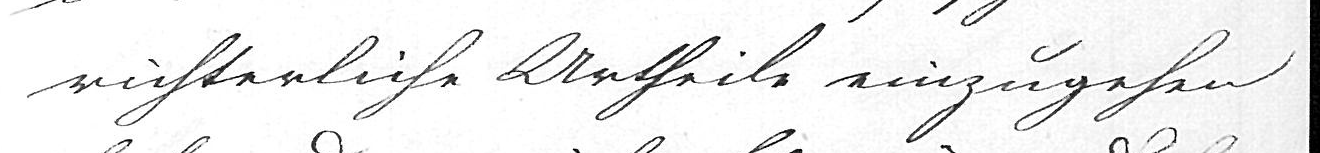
richterliche Urtheile einzugehen
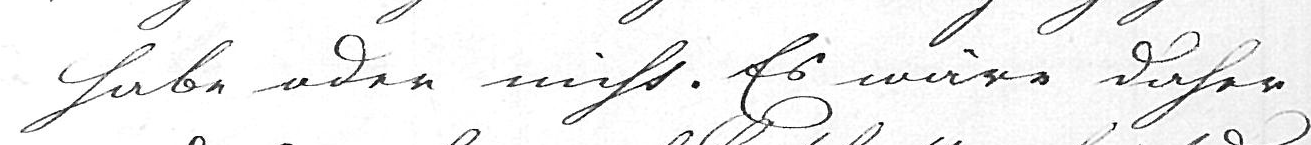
habe oder nicht. Es wäre daher
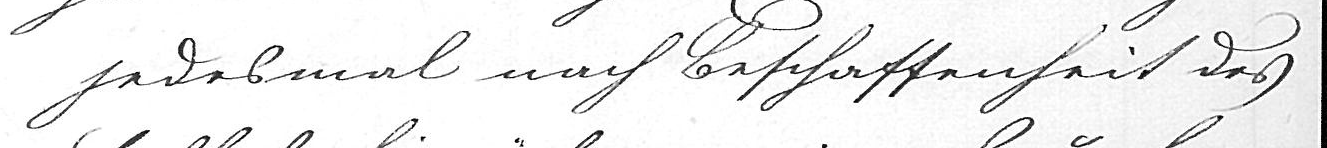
jedesmal nach Beschaffenheit des
